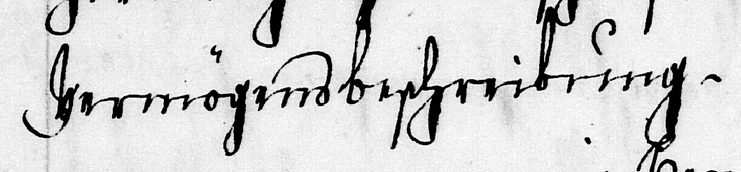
Vermögensbeschreibung-
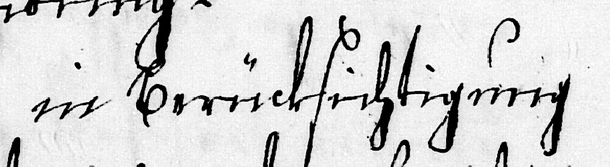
in Berücksichtigung
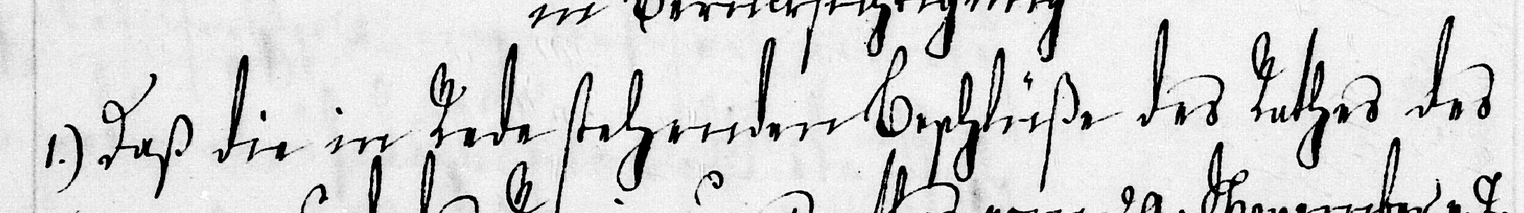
1.) Daß die in Rede stehenden Beschlüße des Rathes des
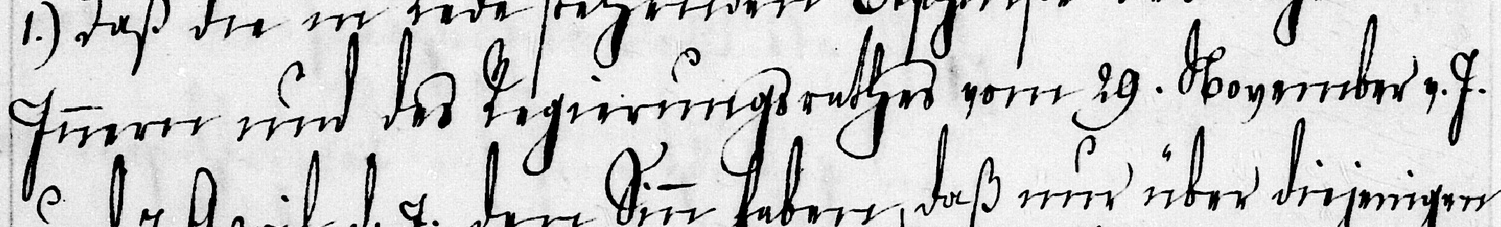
Innern und des Regierungsrathes vom 29. November v.
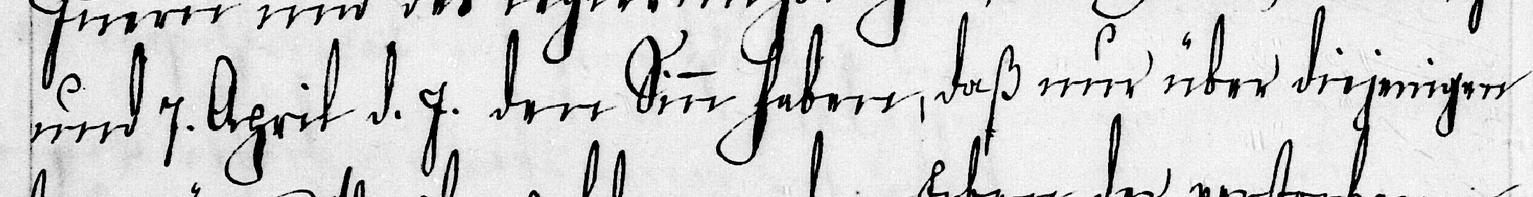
und 7. April d. J. den Sinn haben, daß nur über diejenigen
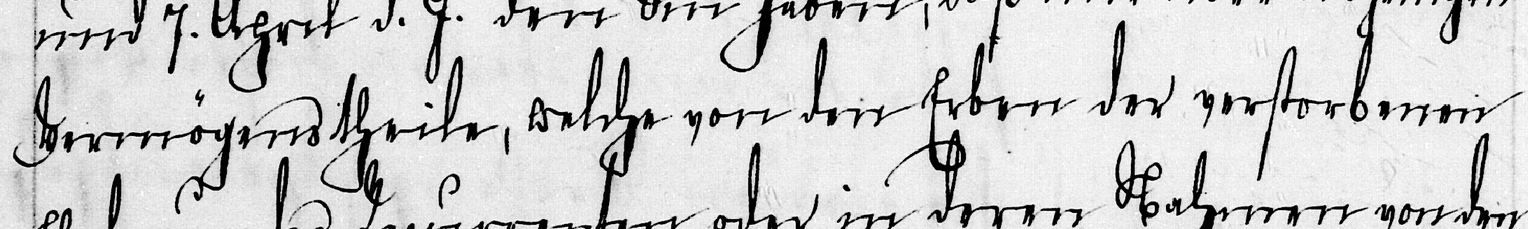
Vermögenstheile, welche von den Erben der verstorbenen
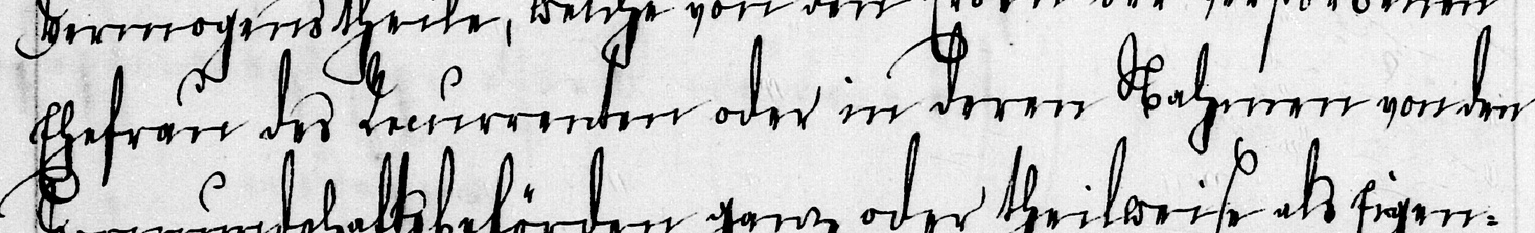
Ehefrau des Recurrenten oder in deren Nahmen von den
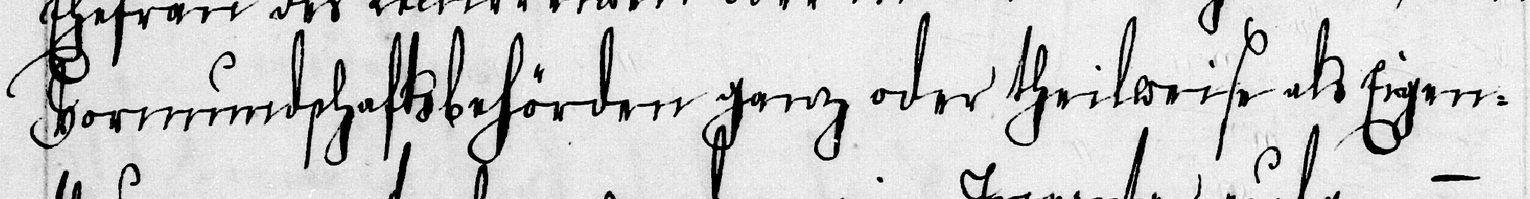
Vormundschaftsbehörden ganz oder theilweise als Eigen¬
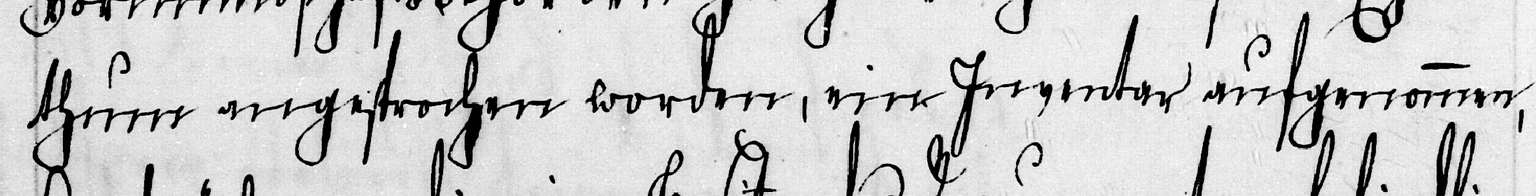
thum angesprochen worden, ein Inventar aufgenommen,
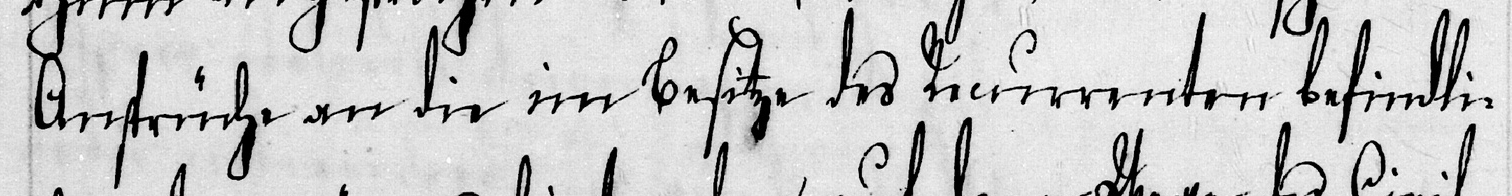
Ansprüche an die im Besitze des Recurrenten befindli¬
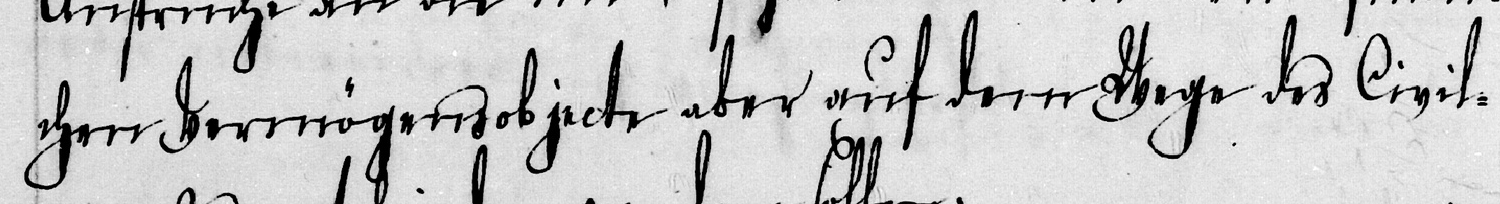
chen Vermögensobjecte aber auf dem Wege des Civil¬
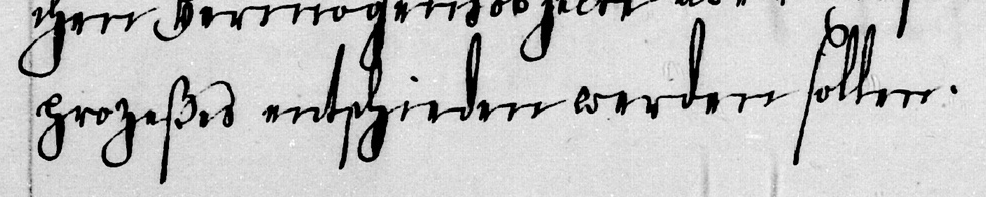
prozeßes entschieden werden sollen.
